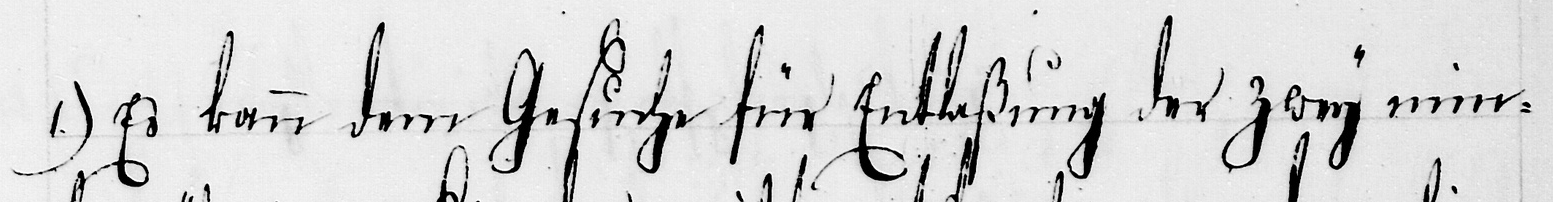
1.) Es kann dem Gesuche für Entlaßung der zwey min¬
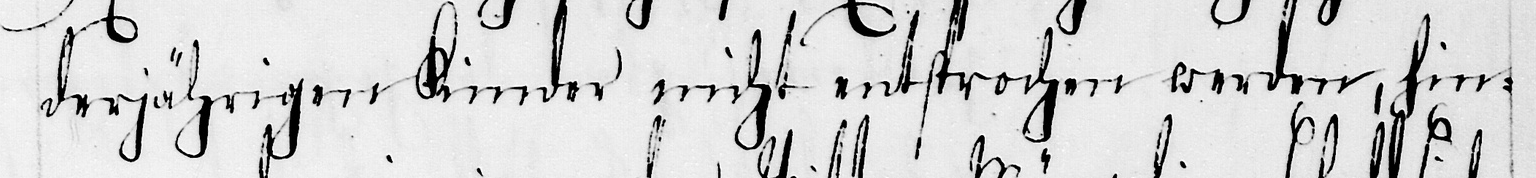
derjährigen Kinder nicht entsprochen werden, hin¬
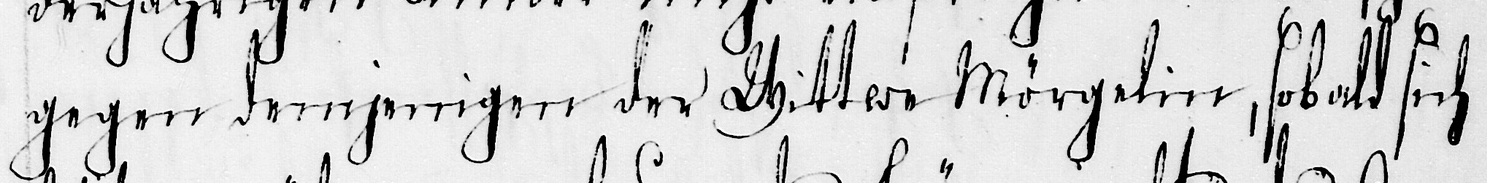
gegen demjenigen der Wittwe Mörgelin, sobald sich
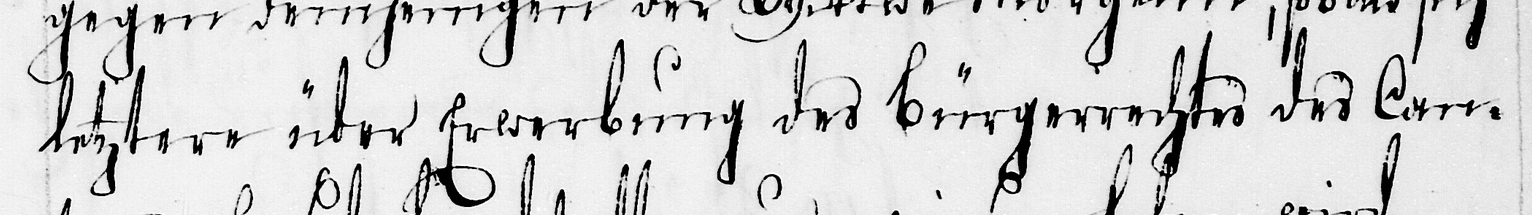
letztere über Erwerbung des Bürgerrechtes des Can¬
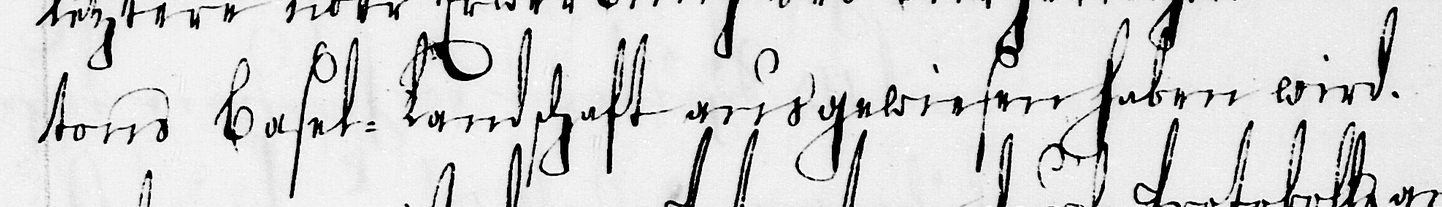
tons Basel-Landschaft ausgewiesen haben wird.
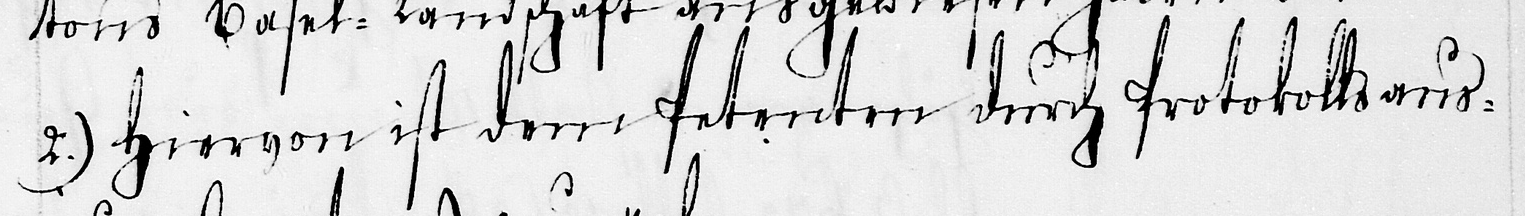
2.) Hiervon ist dem Petenten durch Protokollsaus¬
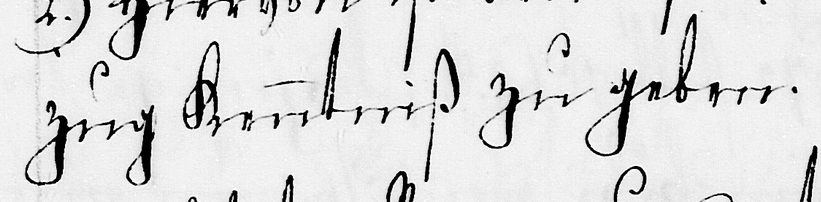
zug Kenntniß zu geben.
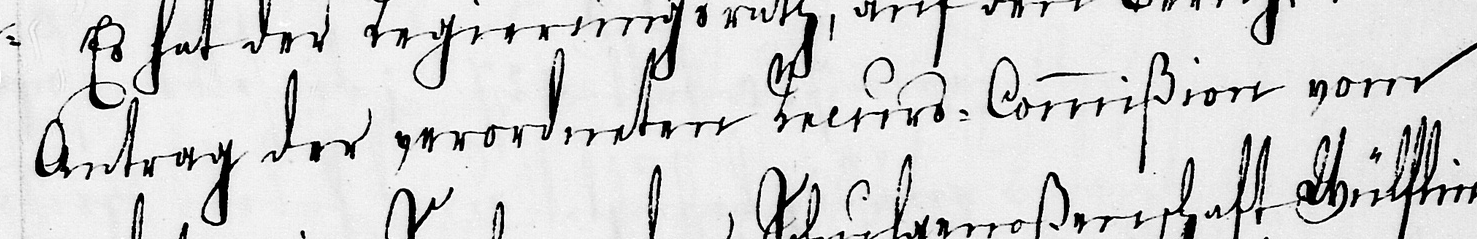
Antrag der verordneten Recurs-Commißion vom
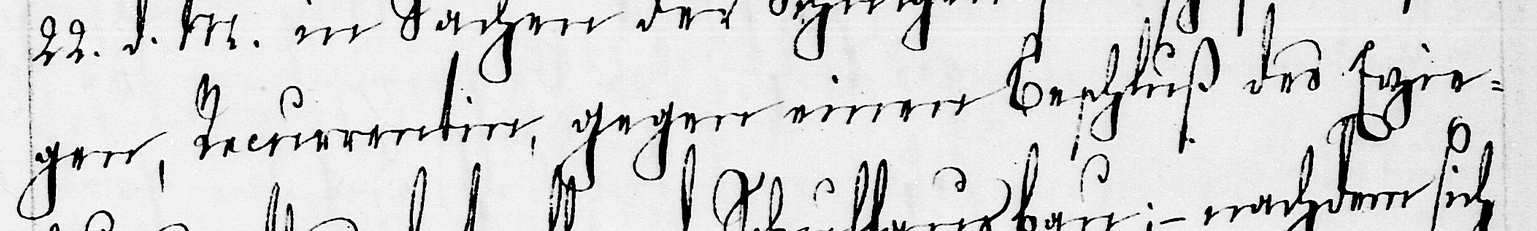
gen, Recurrentin, gegen einen Beschluß des Erzie¬
